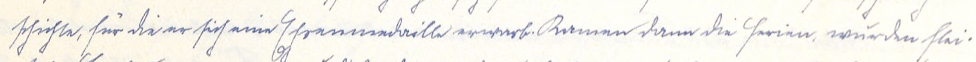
schichte, für die er sich eine Ehrenmedaille erwarb. Kamen dann die Ferien, wurde feli-
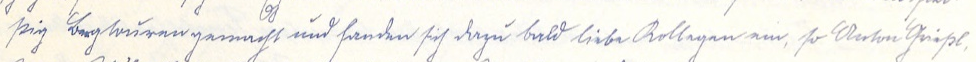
ßig Bergtouren gemacht und fanden sich dazu bald liebe Kollegen ein, so Anton Geißl,
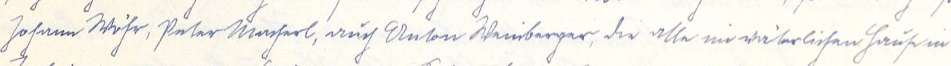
Johann Woher, Peter Marcherl, auch Anton Weinberger, die alle im väterlichen Hause in
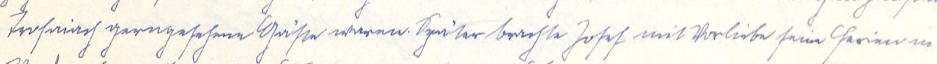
Trofaiach gerngesehen Gäste waren. Später brachte Josef mit Vorliebe seine Ferien in
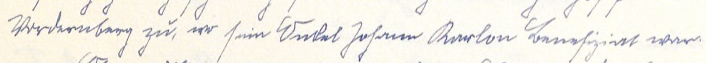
Vardernberg zu, wo sein Onkel Johann Karlon Benefiziert war.
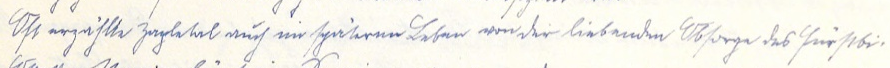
Oft erzählte Zapletal auch im späteren Leben von der liebenden Obsorge des Fürstbi-
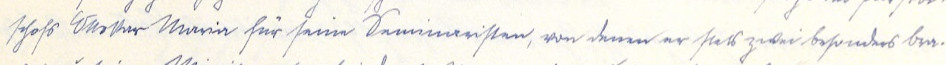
schofs Anton Marwir für seine Seminaristen, von denen er stets zwei besonders bra-
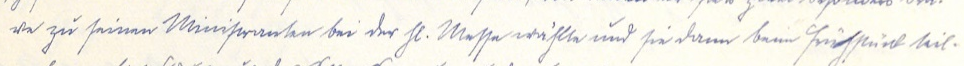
ve zu seinen Ministranten bei der hl. Messe wählte und sie dann beim Frühstück teil-
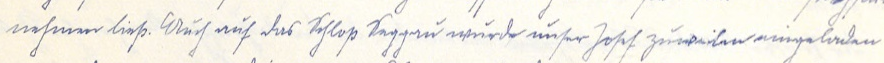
nehmen ließ. Auch auf das Schloß Seggau wurde unser Josef zuweilen eingeldaden.
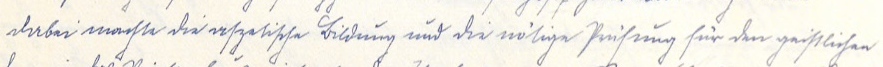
Dabei machte die aszetische Bildung und die nötige Prüfung für den geistlichen
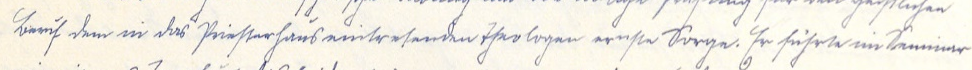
Beruf dem in das priesterhaus eintretenden Theologen rechte Sorge. Er führte im Seminar
